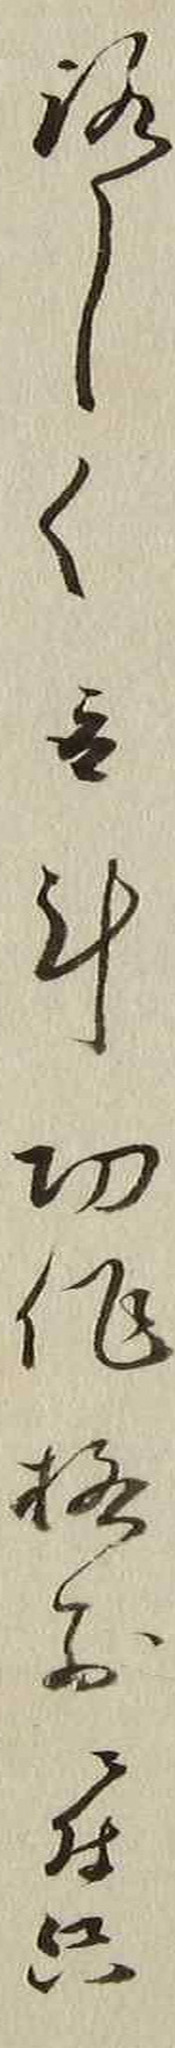ろしく取計功作格別ニ付只
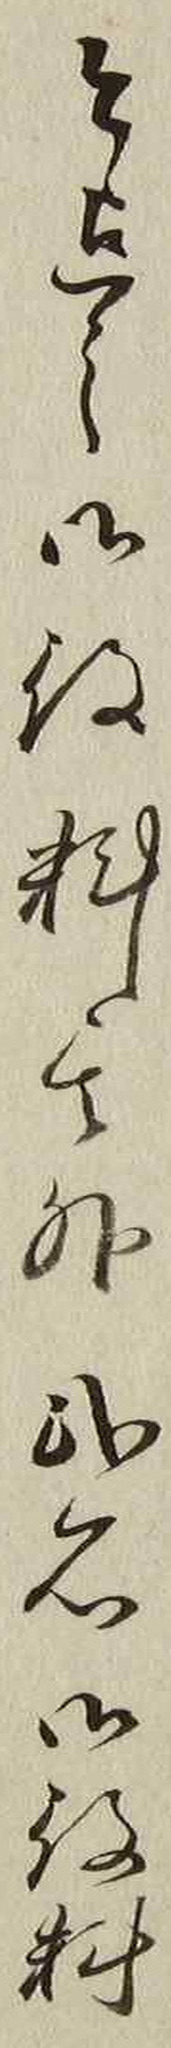今迄之御役料其外弐石御役料
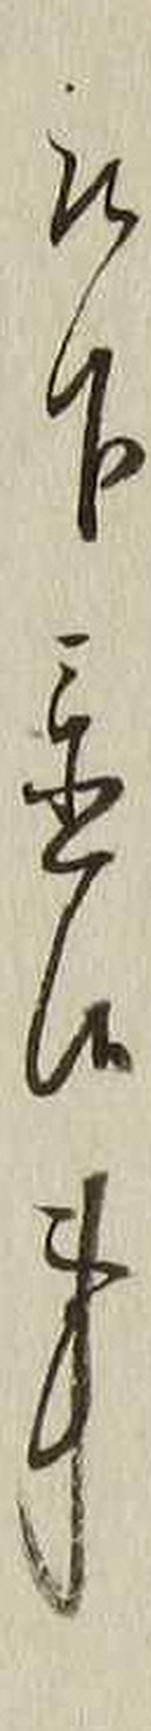被下置候事
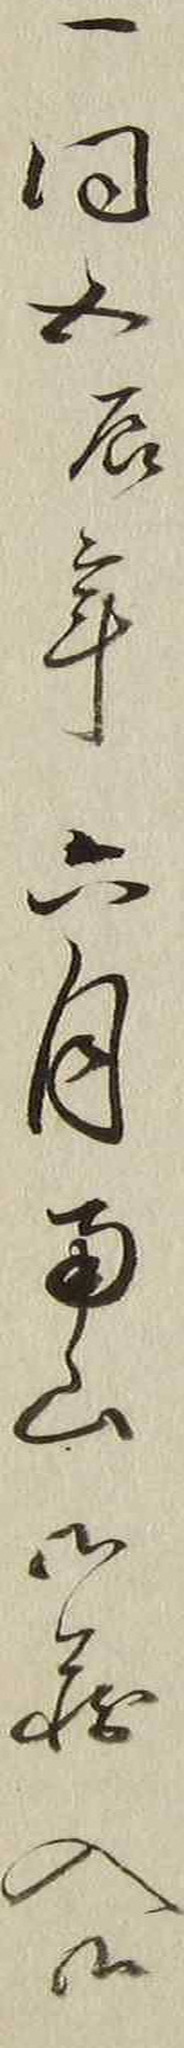一同五辰年六月南山御蔵入御
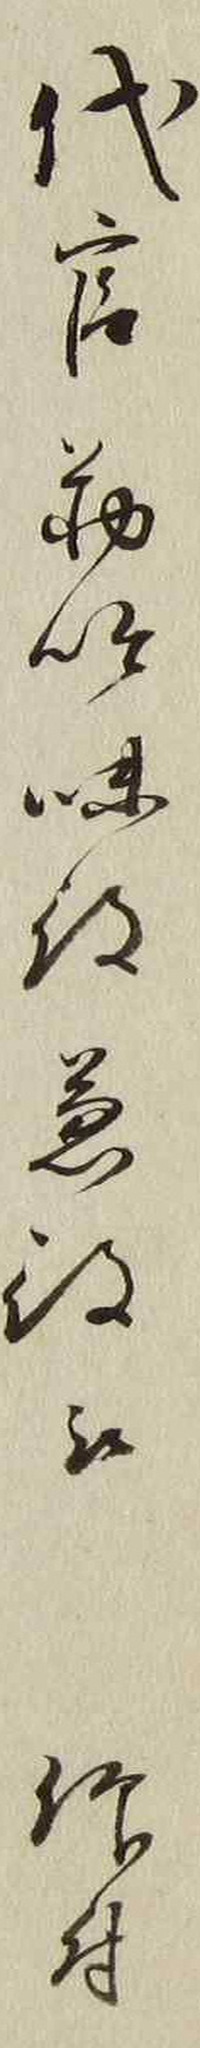代官勤吟味役兼役被仰付
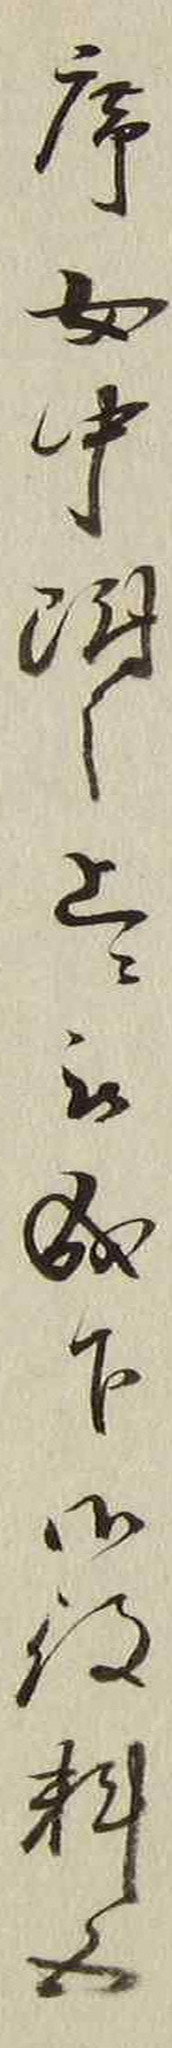席女中附之上ニ被成下御役料五
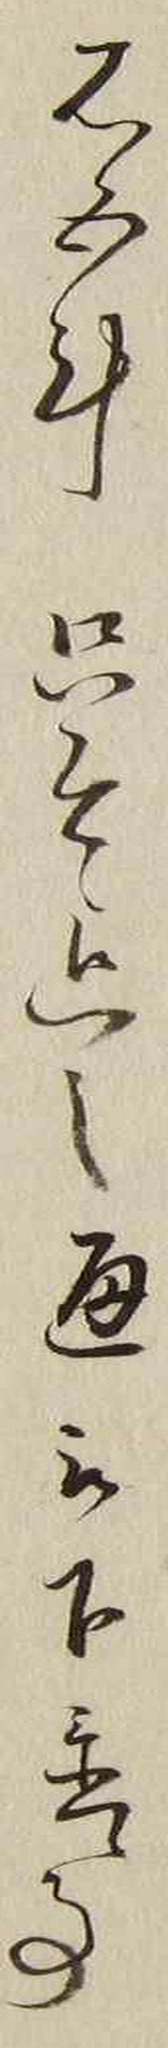石五斗只今迄之通被下置候事
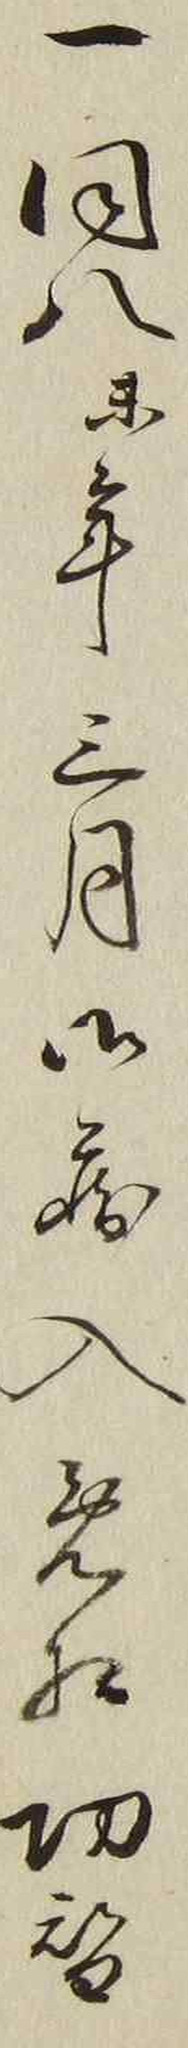一同八未年三月御蔵入免相切替

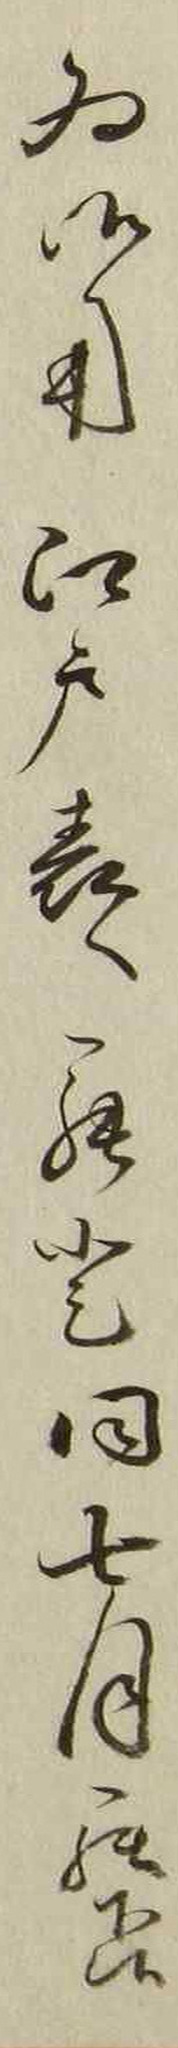為御用江戸表へ罷登同七月罷下候
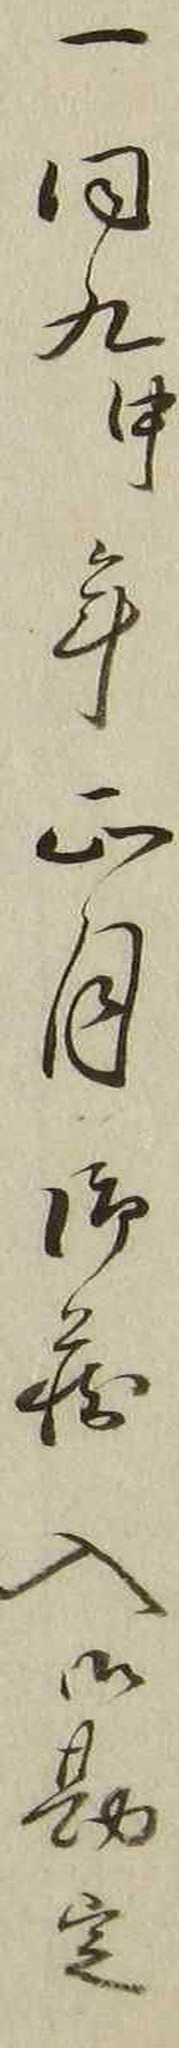一同九申年正月御蔵入御勘定
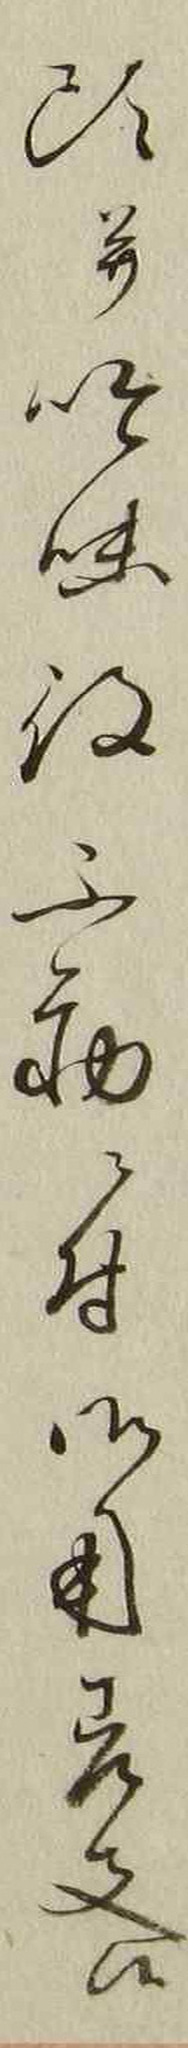頭幷吟味役不勤ニ付御用差支候
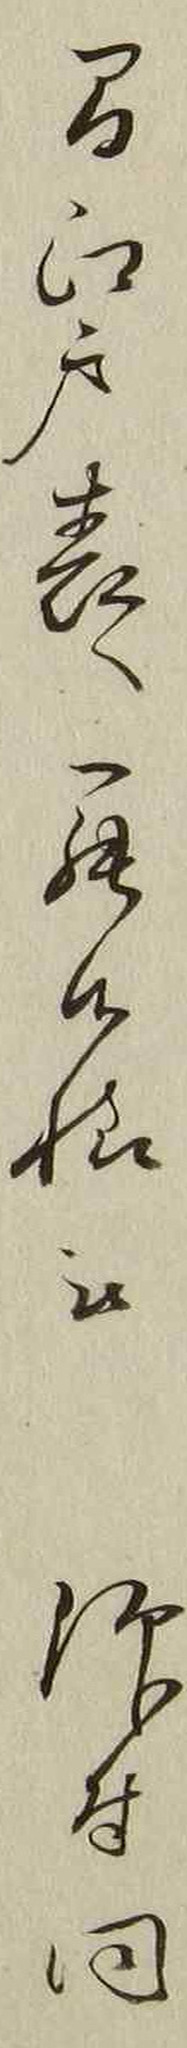間江戸表へ罷候様被仰付同
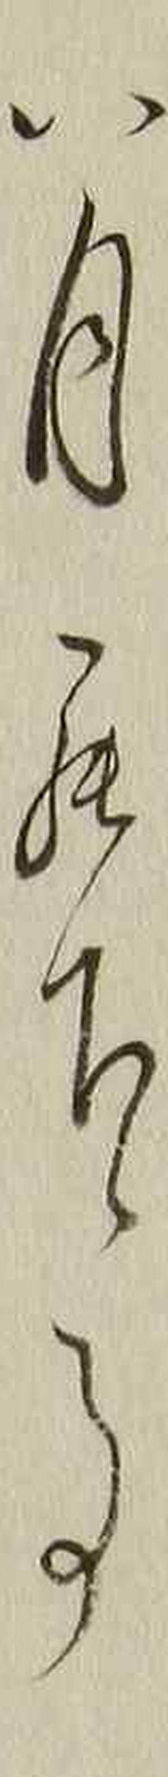八月罷下候事
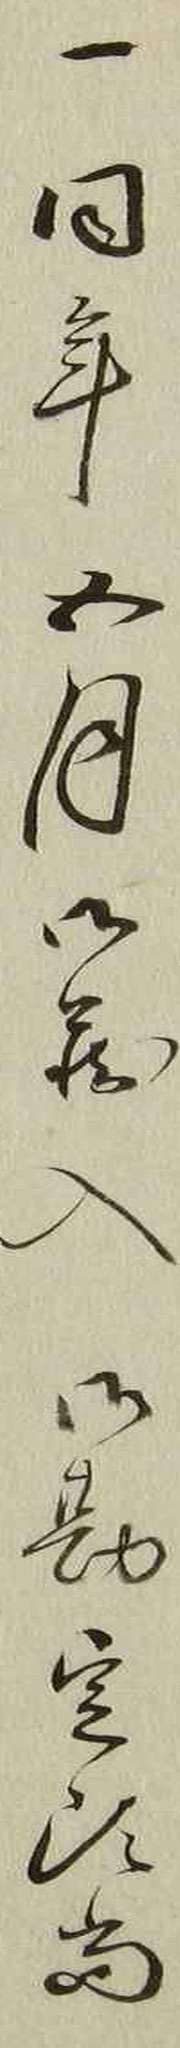一同年五月御蔵入御勘定頭当
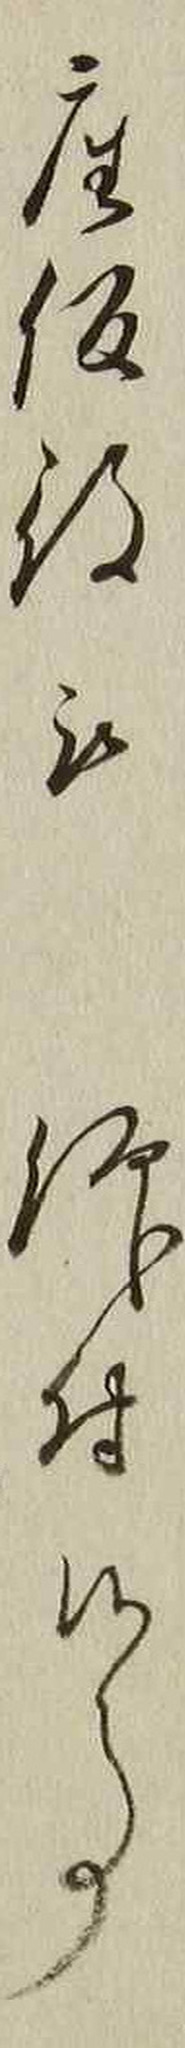座仮役被仰付候事
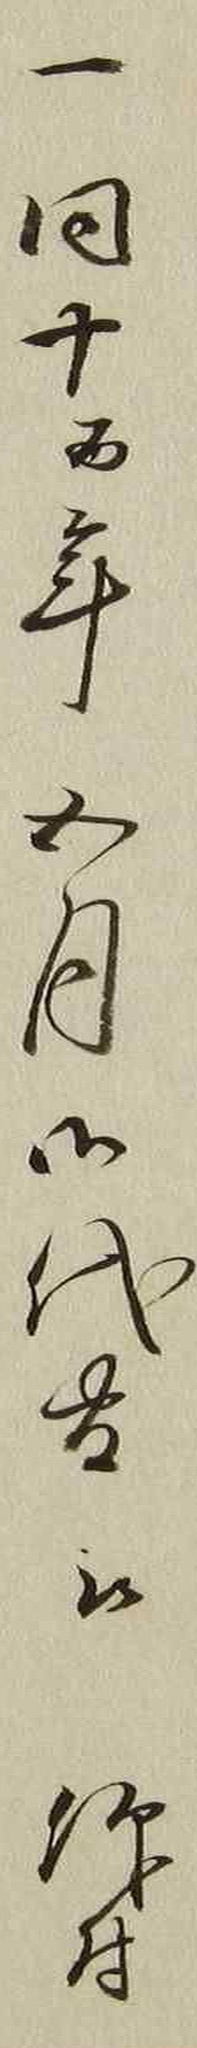一同十酉年五月御代官被仰付
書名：諸士系譜　巻之52　に之部3
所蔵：会津若松市立会津図書館
